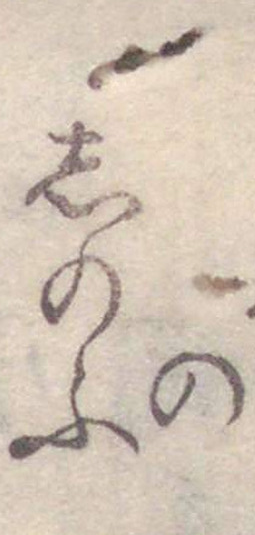しのふ
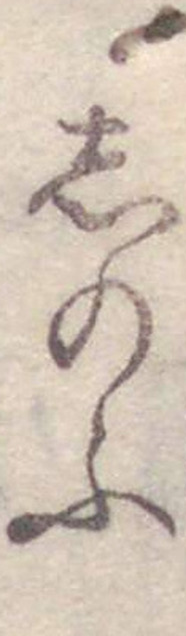しのふ
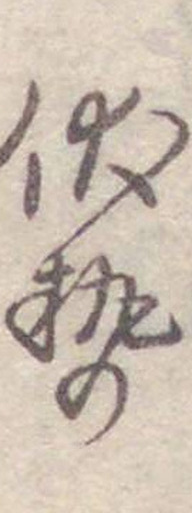伏執の
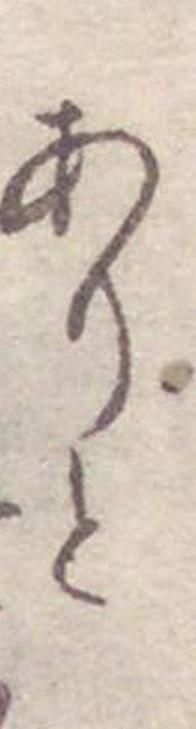ありと
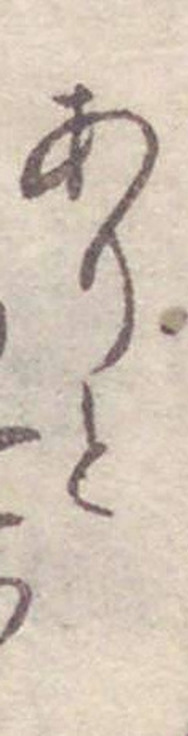ありと
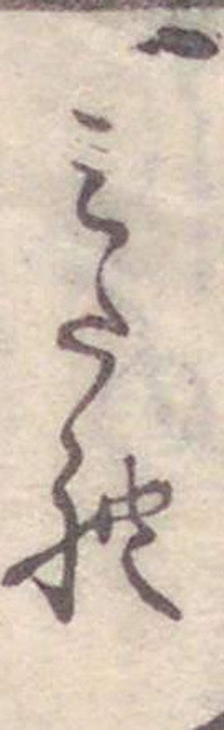みたれ
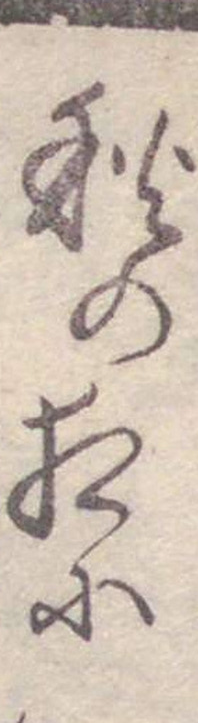秋の夜に
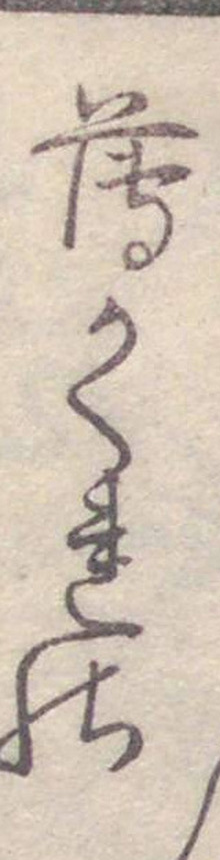薄かくれの
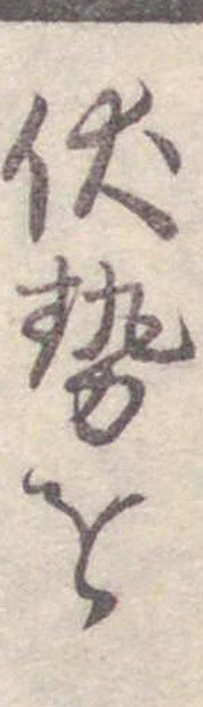伏勢を
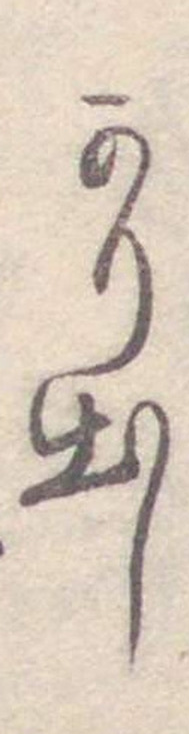かり出し
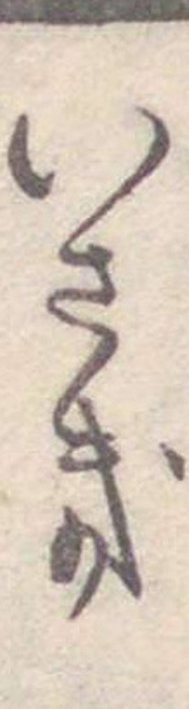いさき

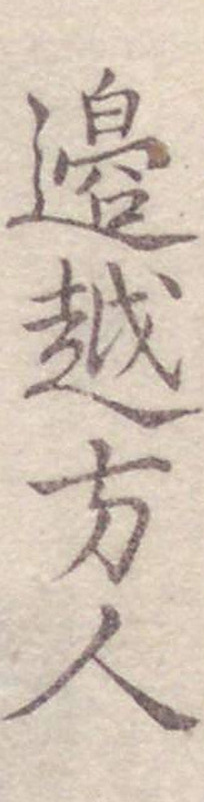辺越方人
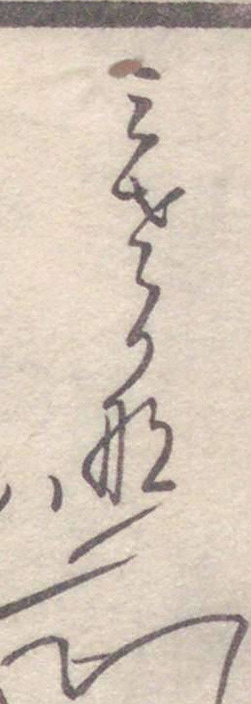みさかな
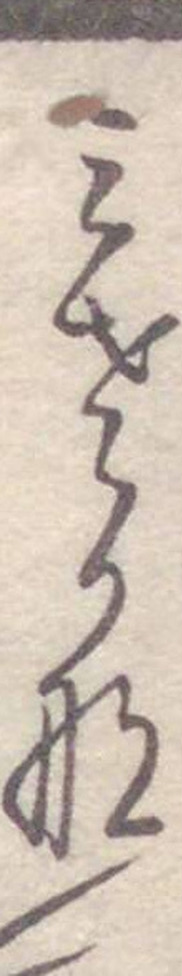みさかな
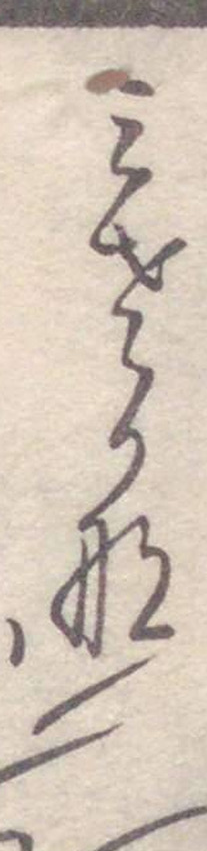みさかな
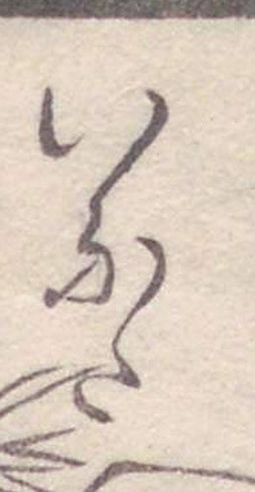いなた
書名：繪本八十宇治川
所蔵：九州大学中央図書館 国文学研究資料館
